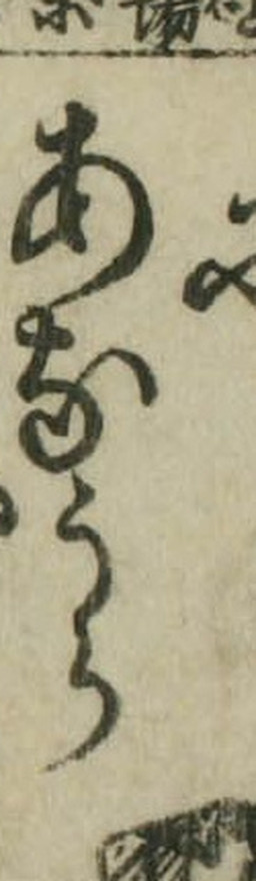あなうら
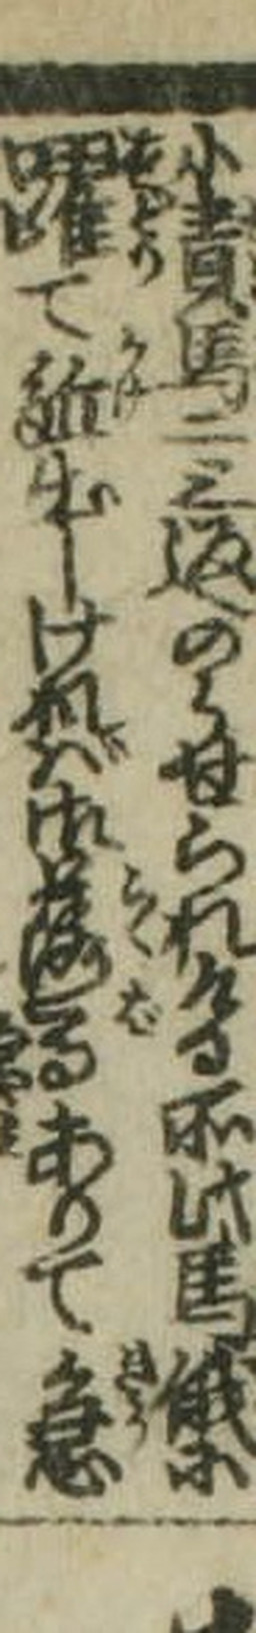躍て駈出しければ御落馬ありて急
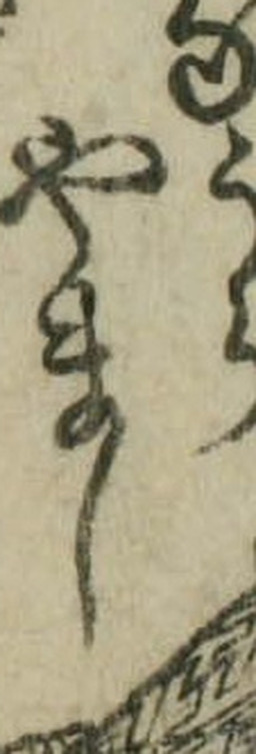やまし
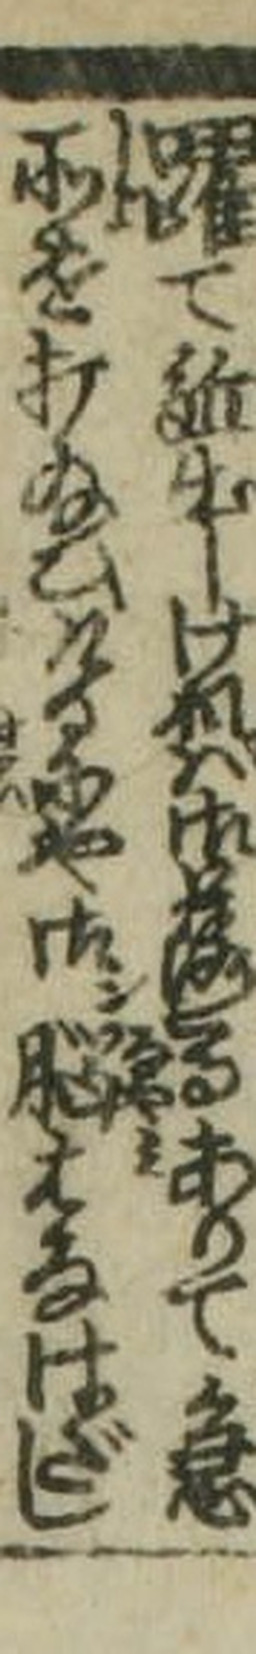所を打給ひけるにや御ん悩はなはだし
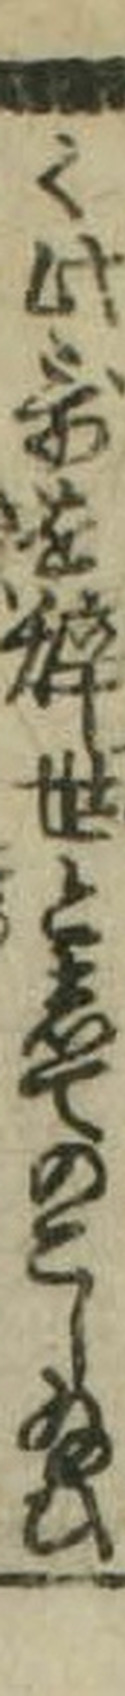く此哥を辞世としてのこし給ひぬ
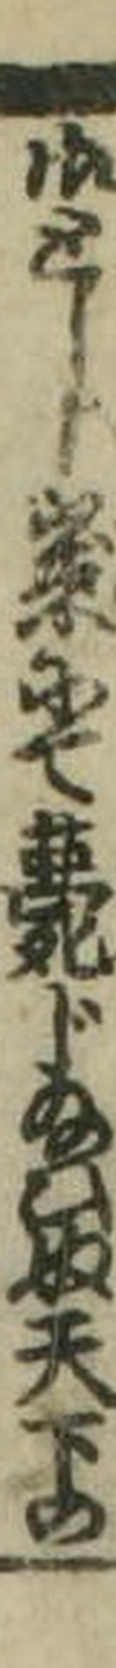御とし十歳にて薨じ給ひぬ天下の
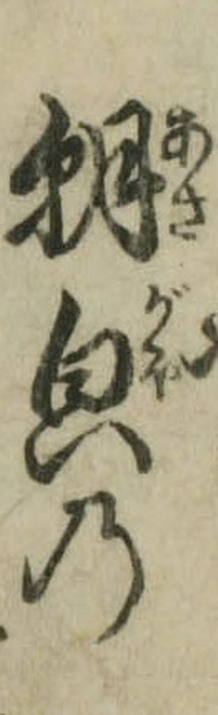朝貌の
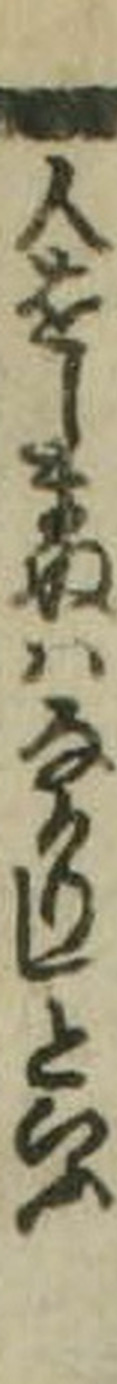人をしまぬはなかりしといふ
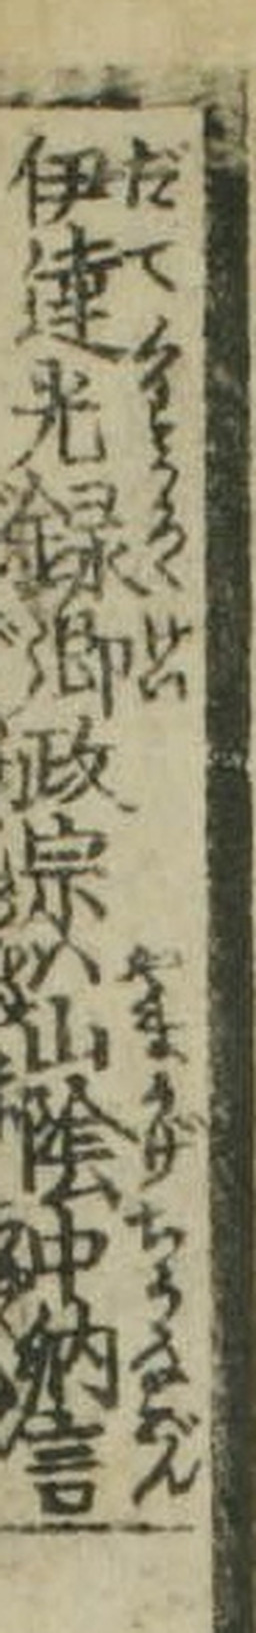伊達光録卿政宗は山陰中納言
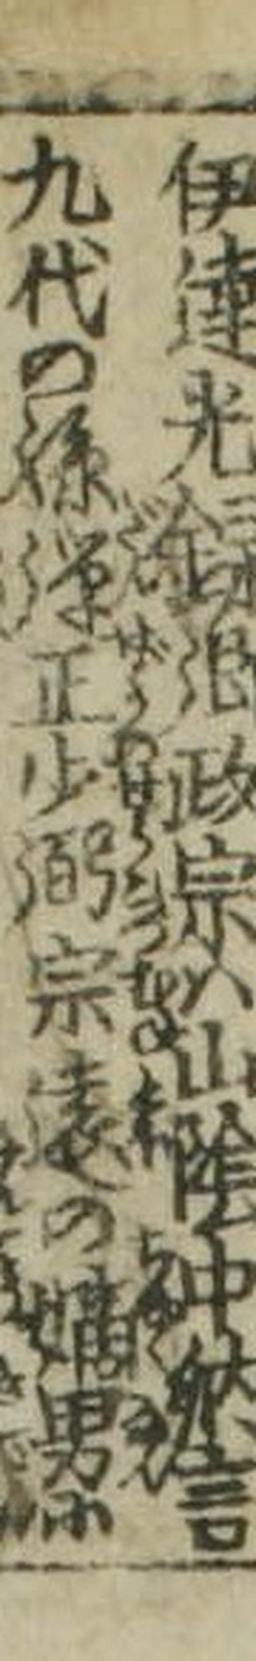九代の孫弾正少弼宗遠の嫡男に
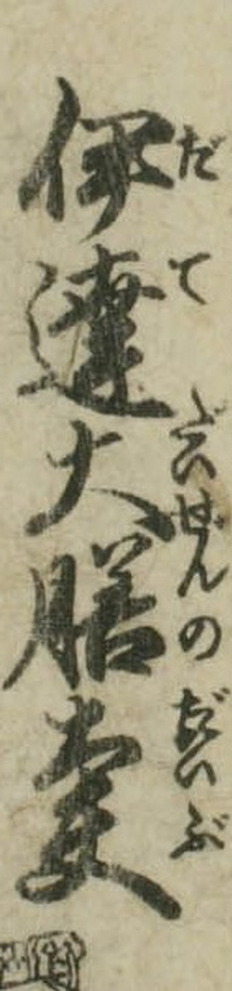伊達大膳太夫
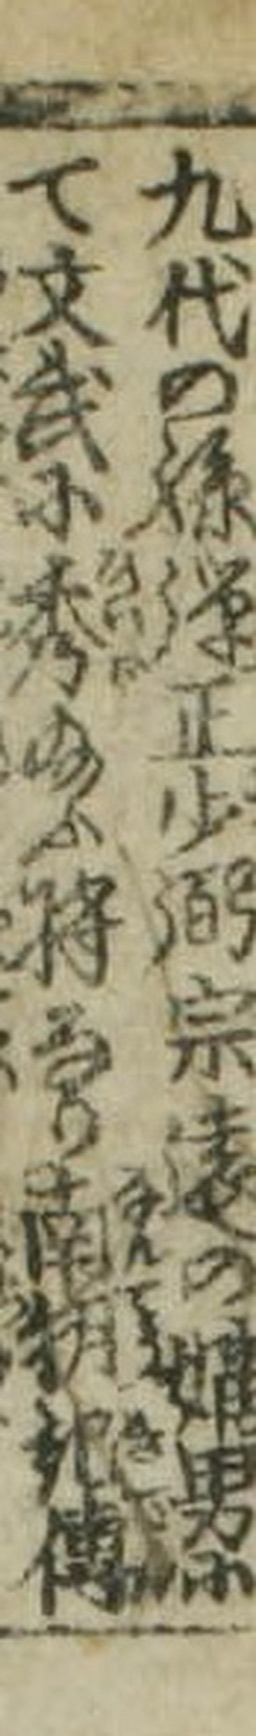て文武に秀給ふ将なり南朝紀伝
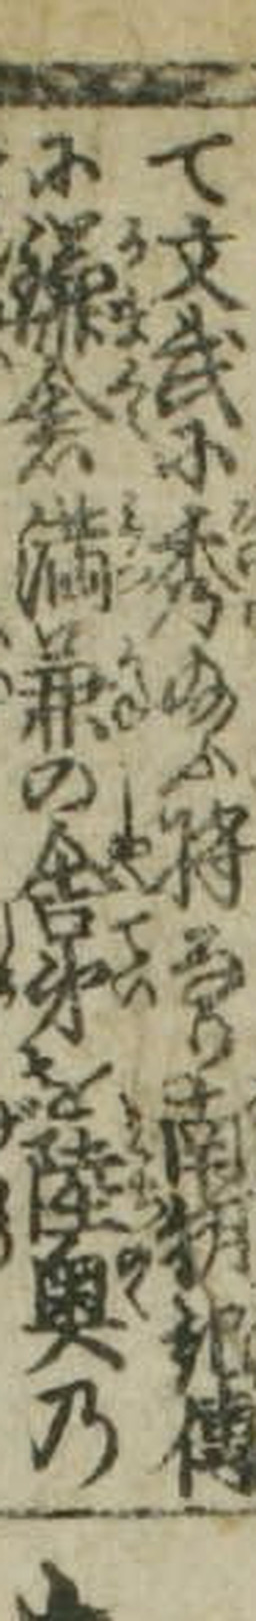に鎌倉満兼の舎弟を陸奥の
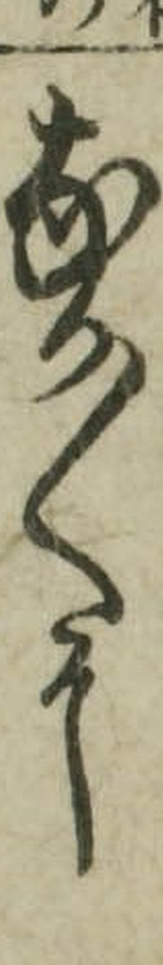なか〳〵に
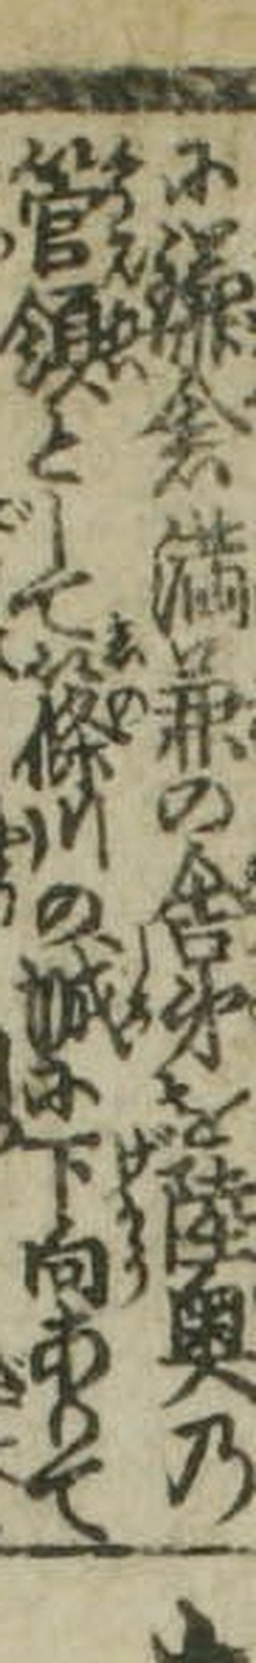管領として篠川の城に下向ありて
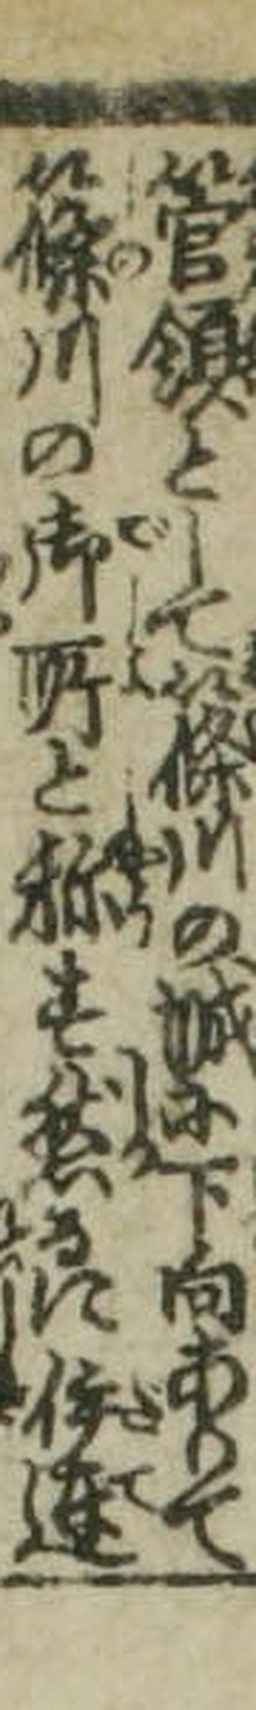篠川の御所と称す然るに伊達
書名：續英雄百人一首
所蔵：東京学芸大学附属図書館
